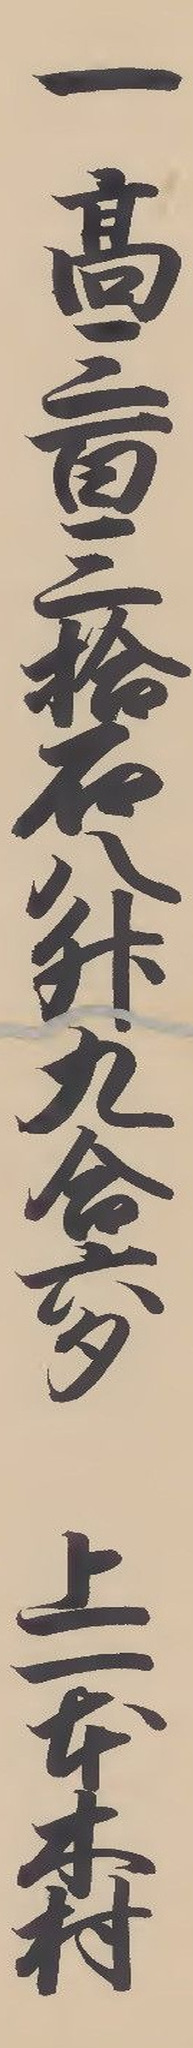一高三百三拾石八升九合六勺上一本木村
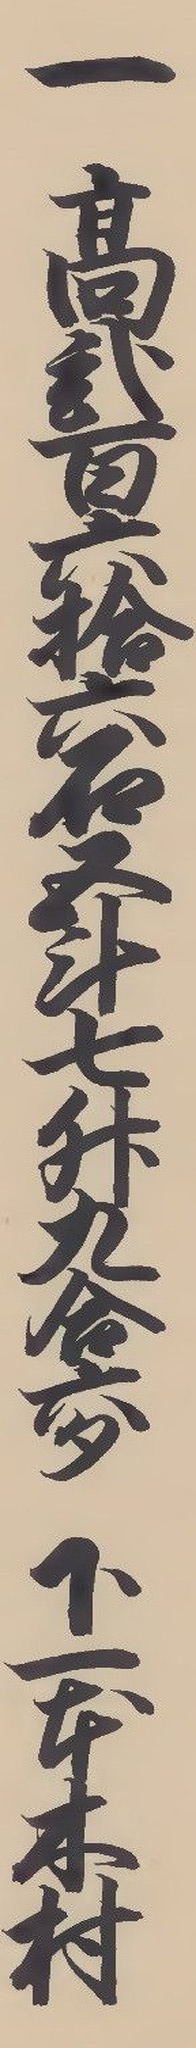一高弐百六拾六石五斗七升九合六勺下一本木村
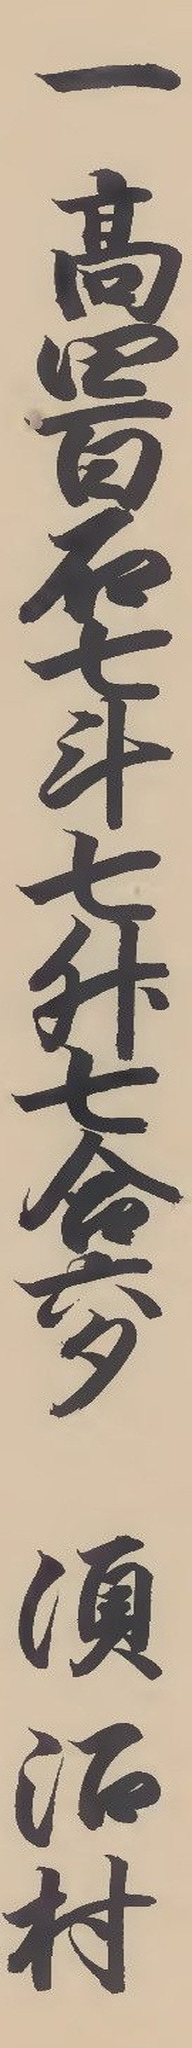一高四百石七斗七升七合六勺須沼村
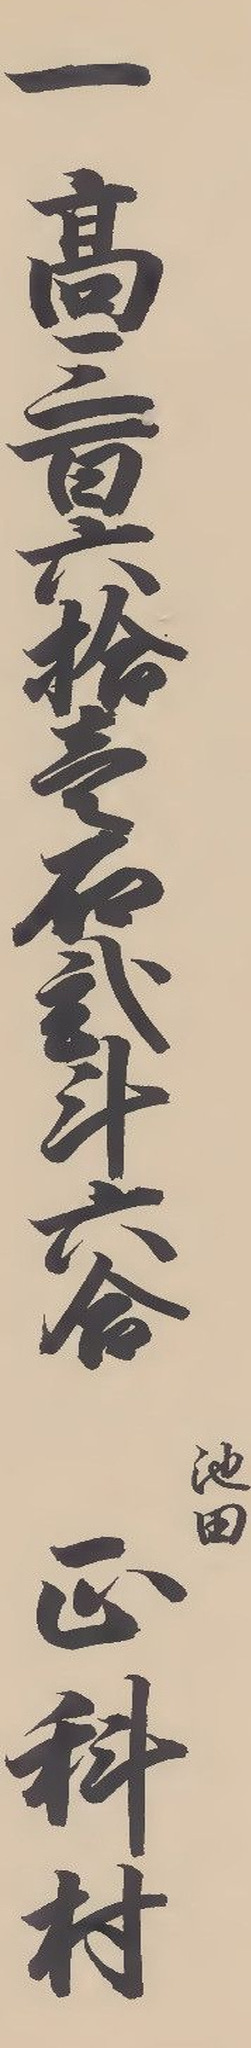一高三百六拾壱石弐斗六合正科村
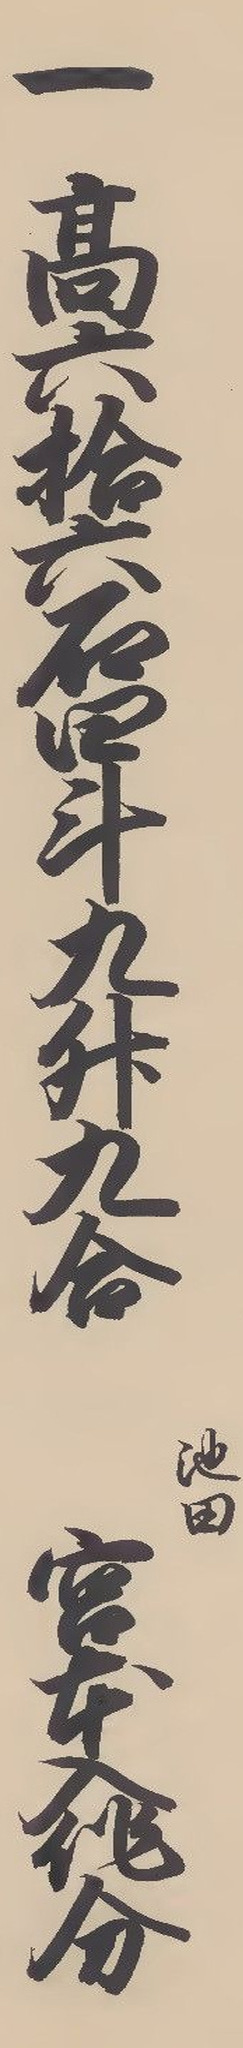一高六拾六石四斗九升九合宮本入作分
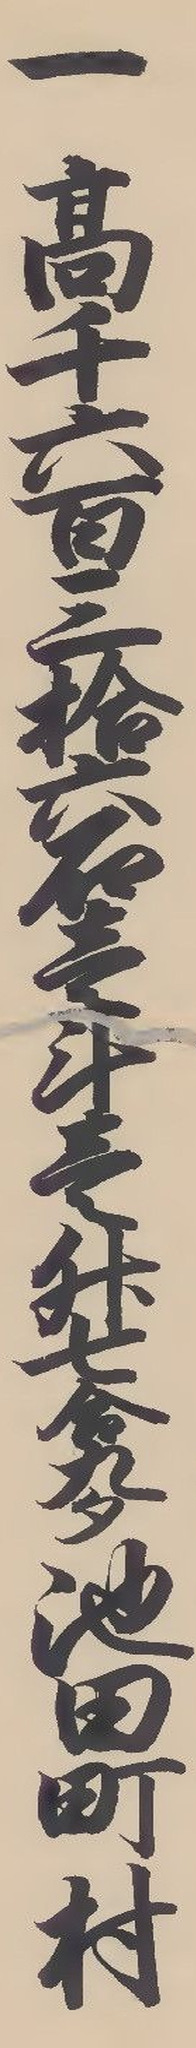一高千六百三拾六石壱斗壱升七合九勺池田町村

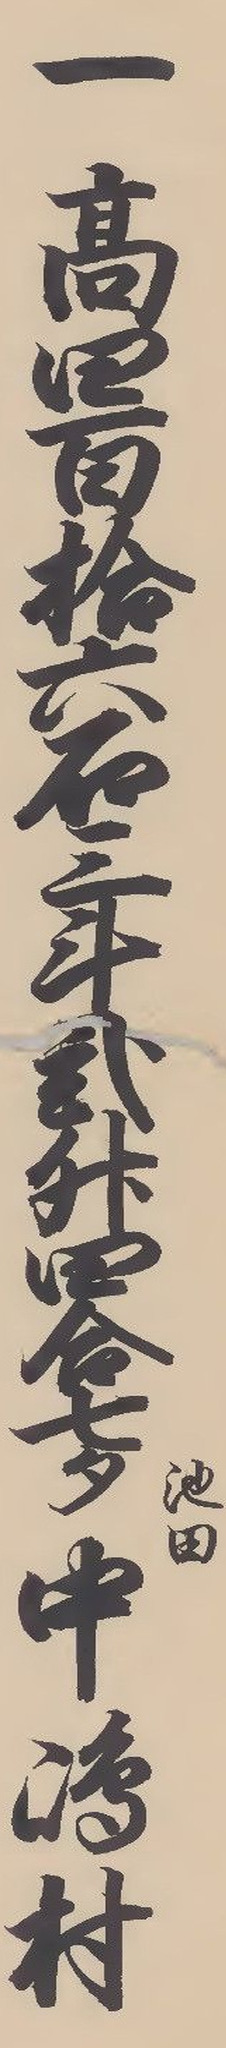一高四百拾六石三斗弐升四合七勺中島村
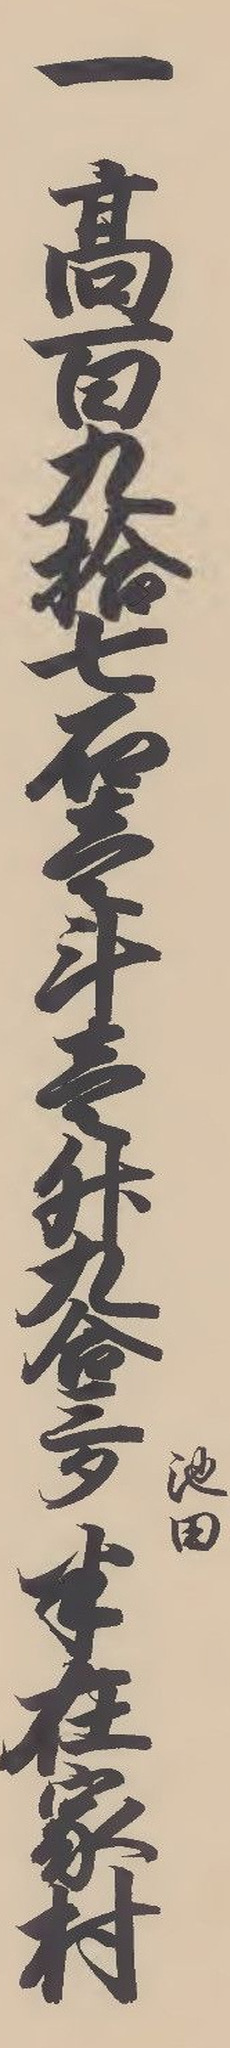一高百九拾七石壱斗壱升九合三勺半在家村
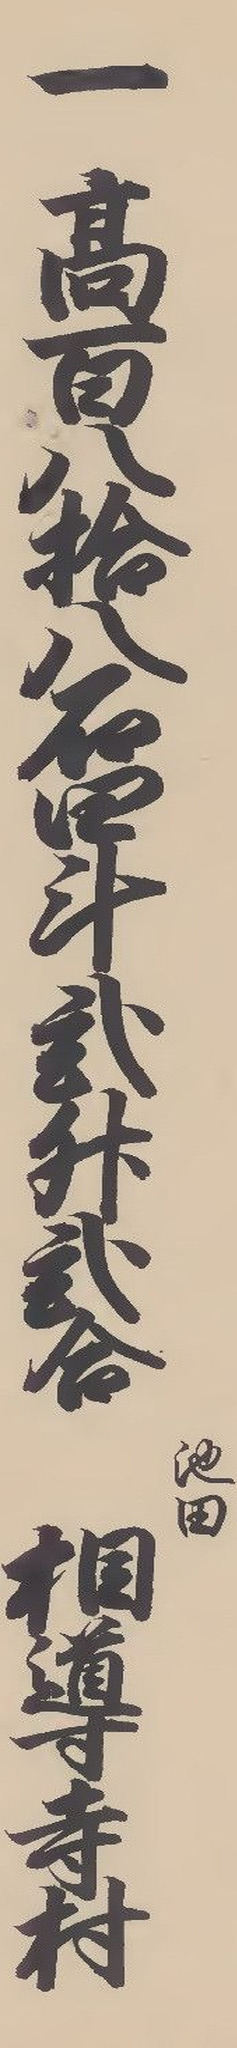一高百八拾八石四斗弐升弐合相導寺村
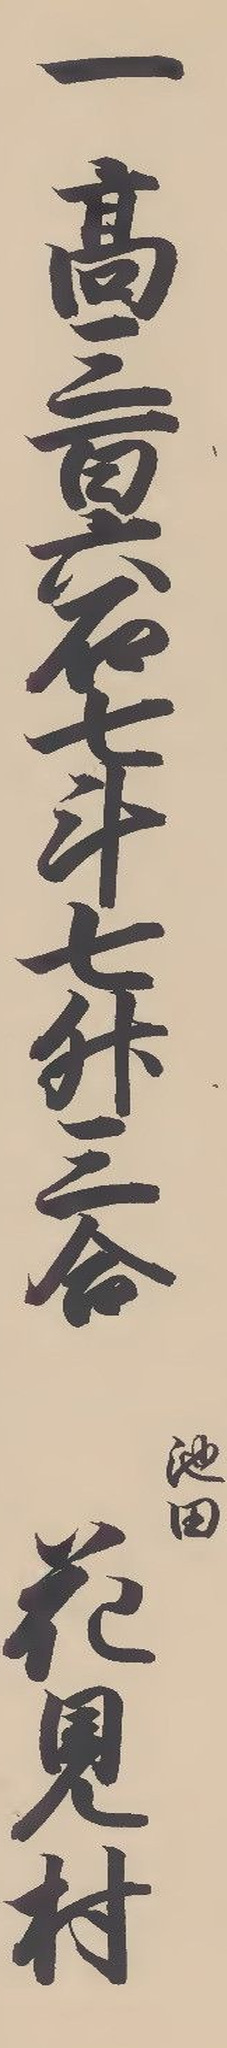一高三百六石七斗七升三合花見村
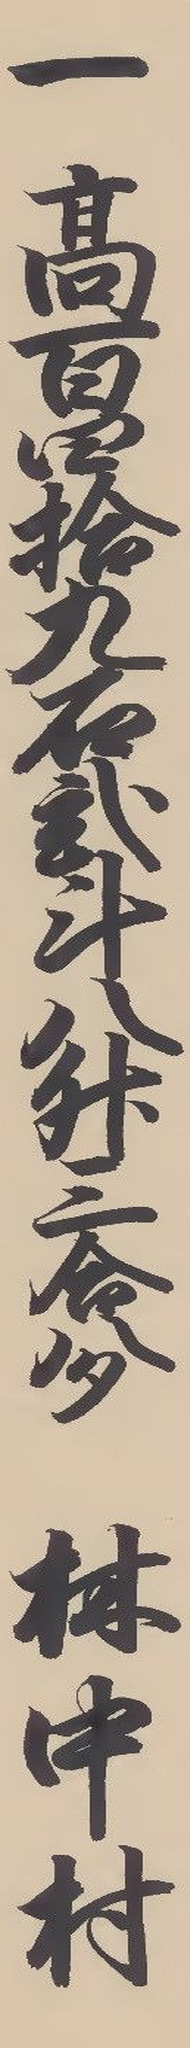一高百四拾九石弐斗八升三合八勺林中村
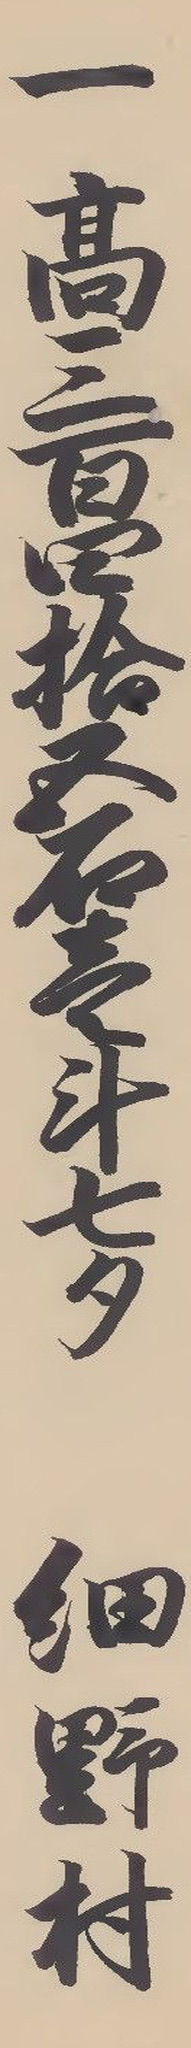一高三百四拾五石壱斗七勺細野村
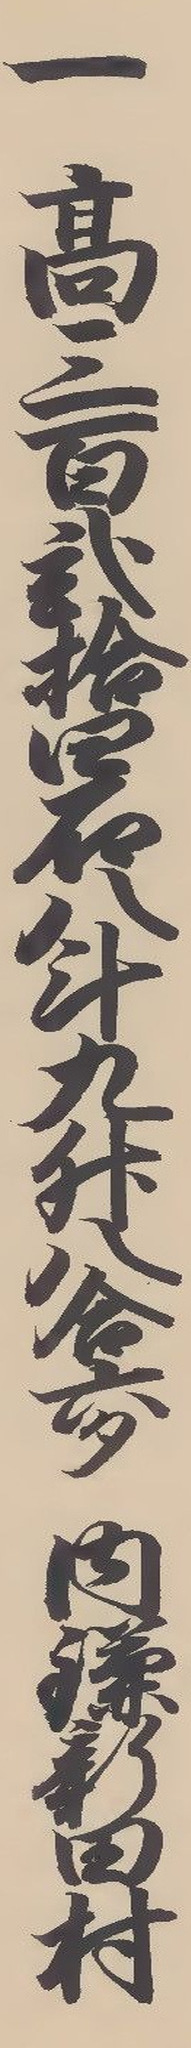一高三百弐拾四石八斗九升八合六勺内鎌新田村
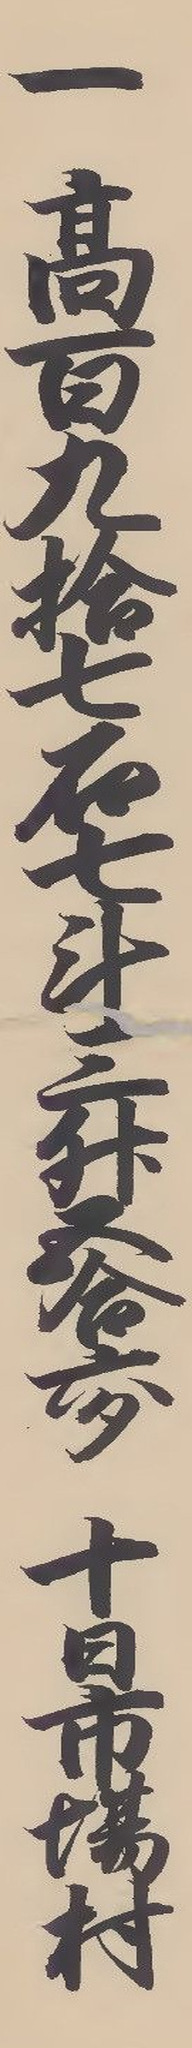一高百九拾七石七斗三升五合六勺十日市場村

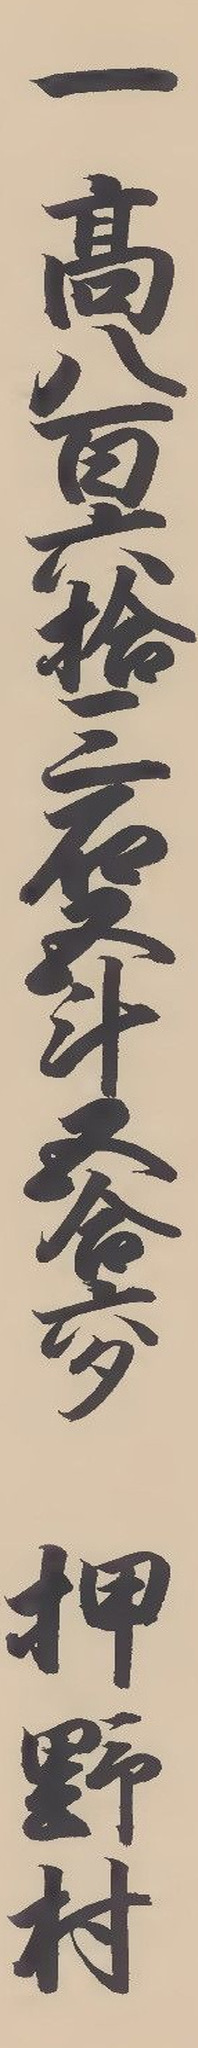一高八百六拾三石五斗五合六勺押野村
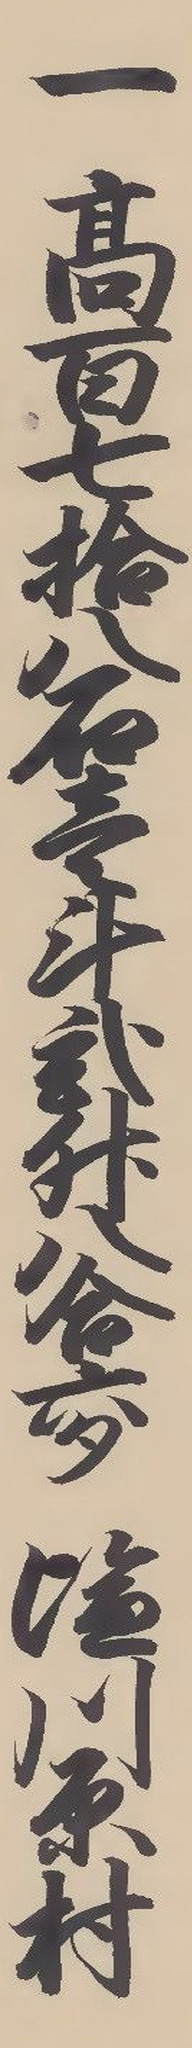一高百七拾八石壱斗弐升八合六勺塩川原村
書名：信濃国郷帳
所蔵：国立公文書館 National Archives of Japan
